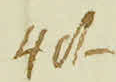48
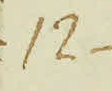12
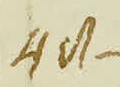48
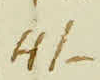41
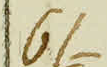61
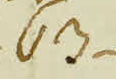63
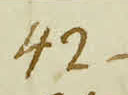42
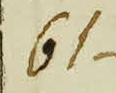61
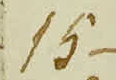15
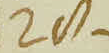28
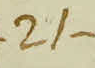21
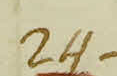24
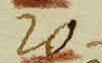20
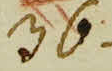36
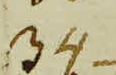34
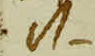8
